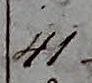41
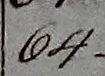64
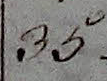35
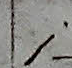1
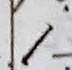1
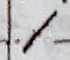1
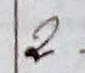2
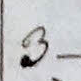3
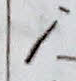1
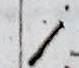1
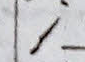1
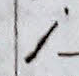1
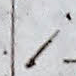1
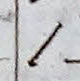1
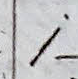1
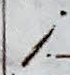1
